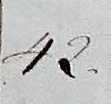42
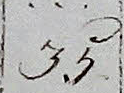35
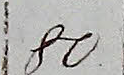80
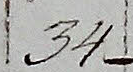34
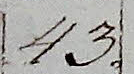43
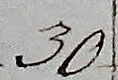30
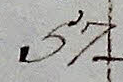57
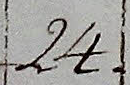24
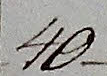40
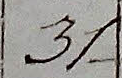31
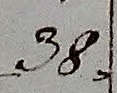38
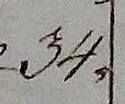34
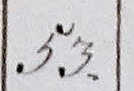53.
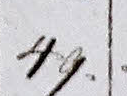49.
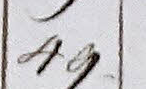49.
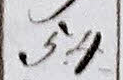54
